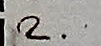2.
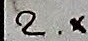2.
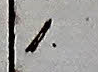1.
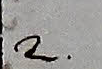2.
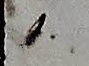1.
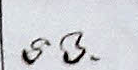53.
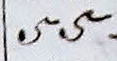55
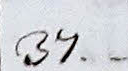37.
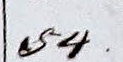54
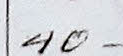40
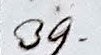39
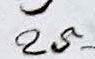25
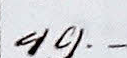49.
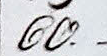60
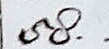58.
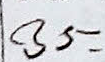35
